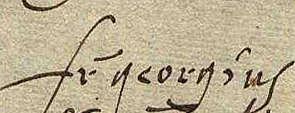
fr̄ georgius
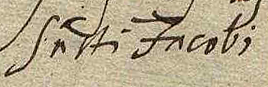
Sn̄cti Iacobi
